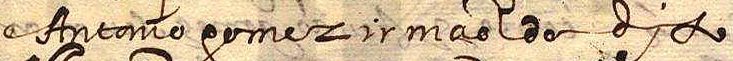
e Antonio gomez irmaõ do djto
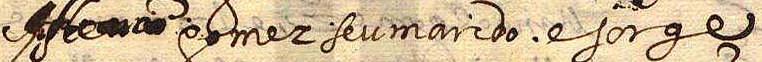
esteuaõ gomez seu marido e jorge
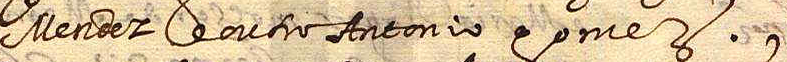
Mendez e outro Antonio gomez
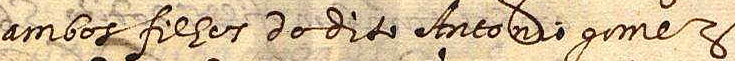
ambos filhos do dito Antonio gomez
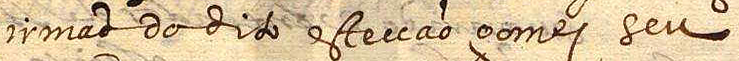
irmaõ do dito esteuaõ gomez seu
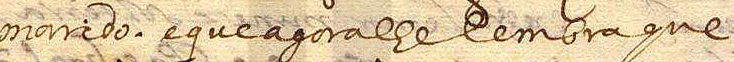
marido. e que agora lhe lembra que
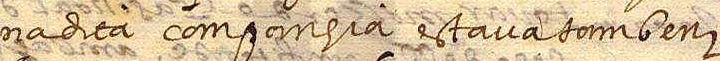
na dita companhia estaua tambem
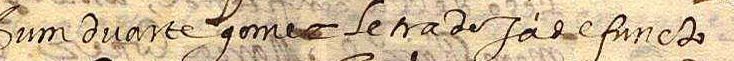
hum duarte gomez Letrado Já defuncto
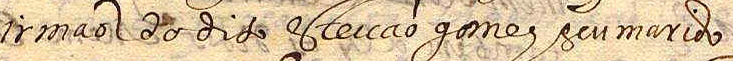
irmaõ do dito esteuaõ gomez seu marido
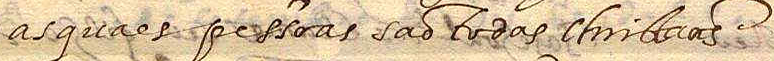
as quaes pess̄oas saõ todas Christaās
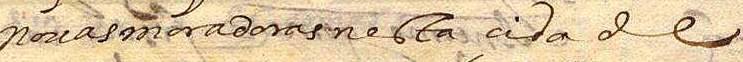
nouas moradoras nesta cidade
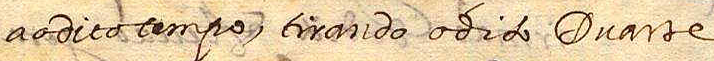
ao dito tempo, tirando o dito Duarte
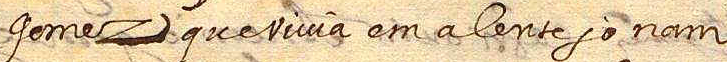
gomez que viuia em alentejo nam
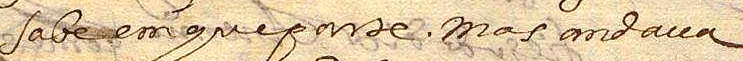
sabe em que parte mas andaua
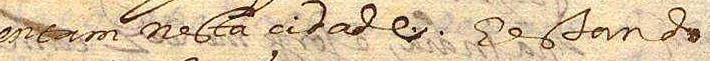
entam nesta cidade E estando
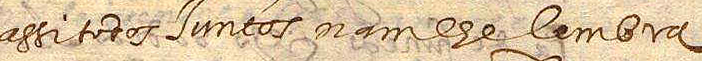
assi todos Iuntos nam lhe lembra
